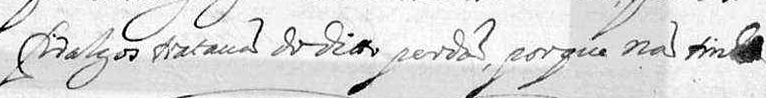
fidalgos tratauaõ do ditto perdaõ, porque naõ tinha
